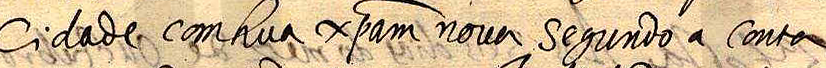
Cidade com hua xp̄am noua segundo a conta
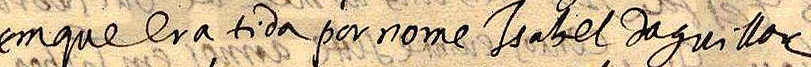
em que era tida por nome Jsabel daguillar
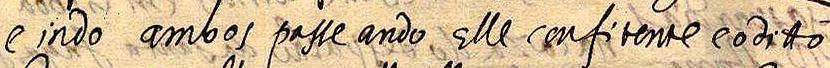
e indo ambos passeando Elle confitente e o ditto
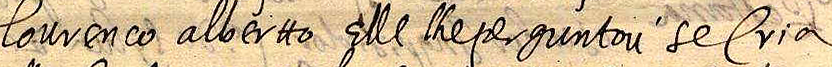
lourenco albertto Elle lhe perguntou se Cria
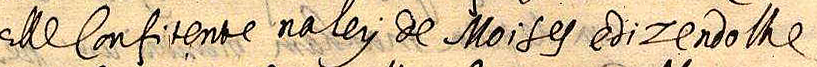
Elle Confitente na ley de Moises e dizendolhe
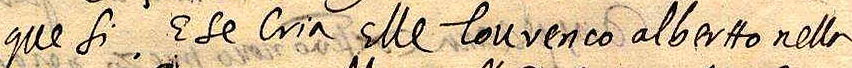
que si E se cria Elle lourenco albertto nella
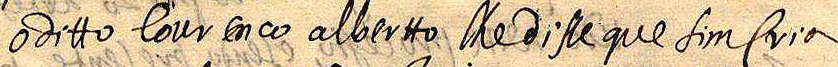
o ditto lourenco albertto lhe disse que sim Cria
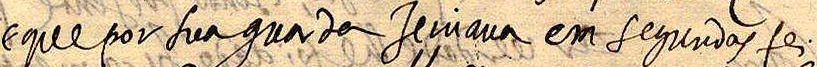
e que por sua guarda Jeiuaua em segundas fei
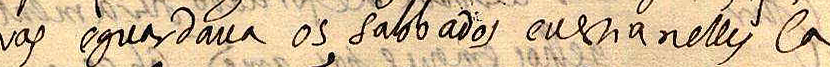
ras e guardaua os sabbados e uestia nelles Ca
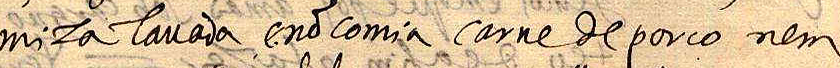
miza lauada e nō comia carne de porco nem
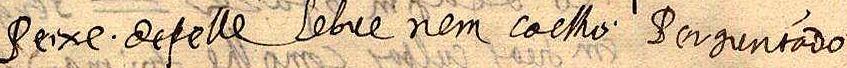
Peixe de pelle Lebre nem coelho. Perguntado
